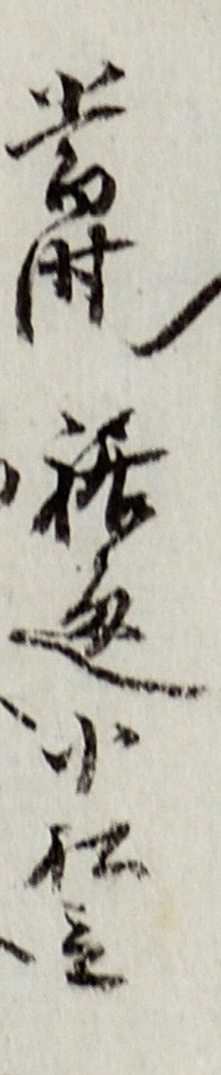当時裾辺小松立
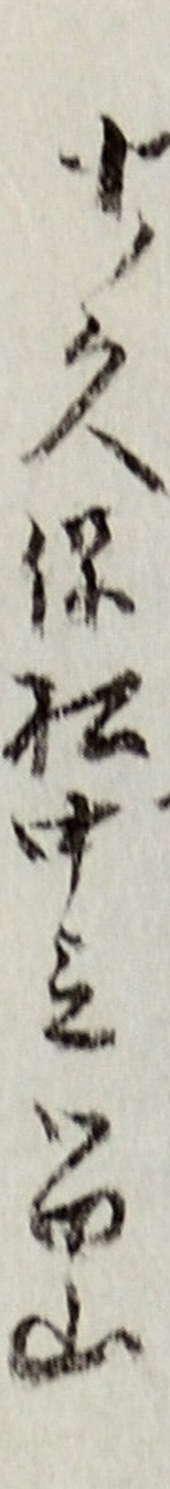北ノ久保松中立留山
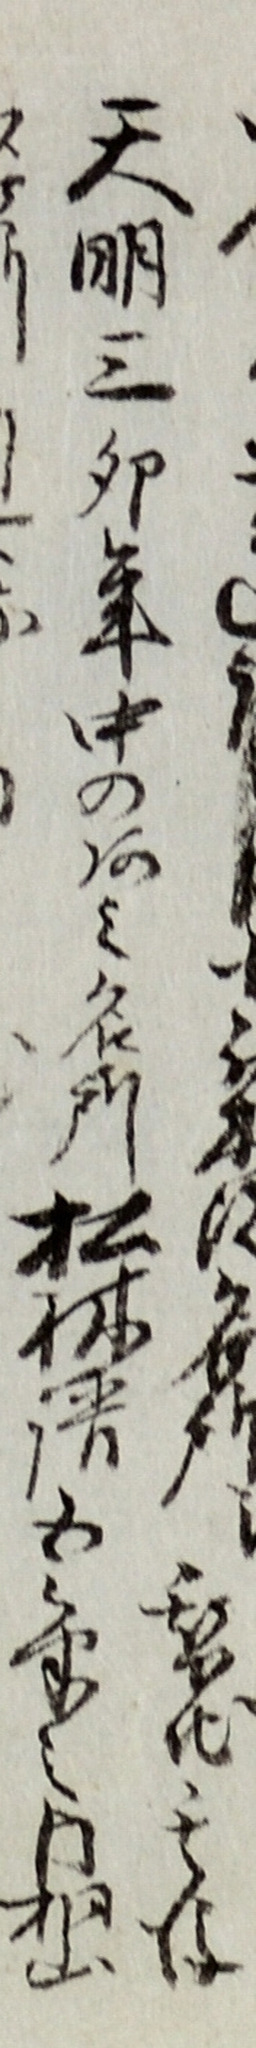天明三卯年中のあみ名所松林請五筆之内桐山
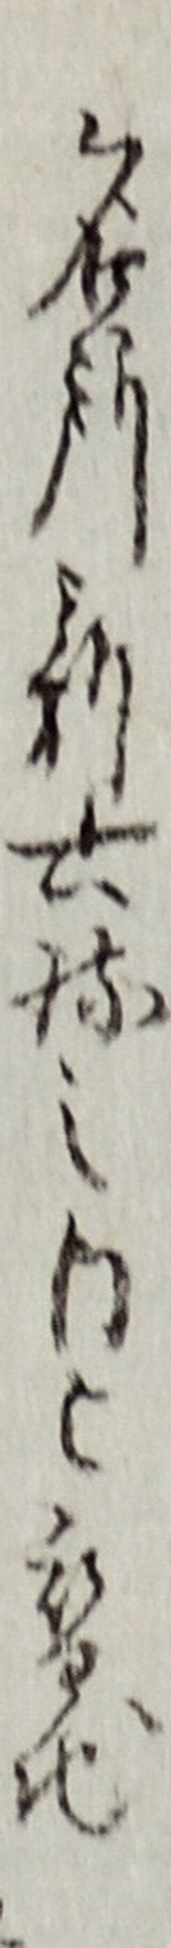名所新六持之内被替地
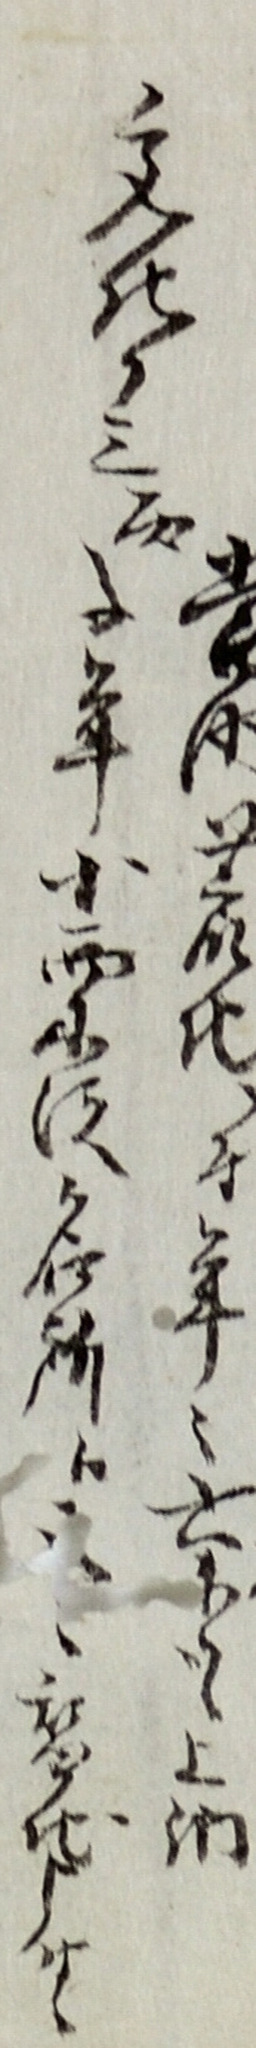文化十三丙子年小栗沢名所替地申付候

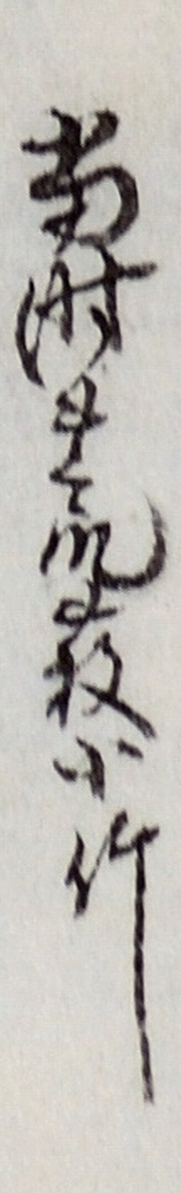当時荒藪小竹
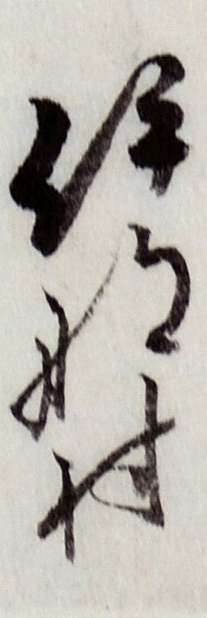伊那村
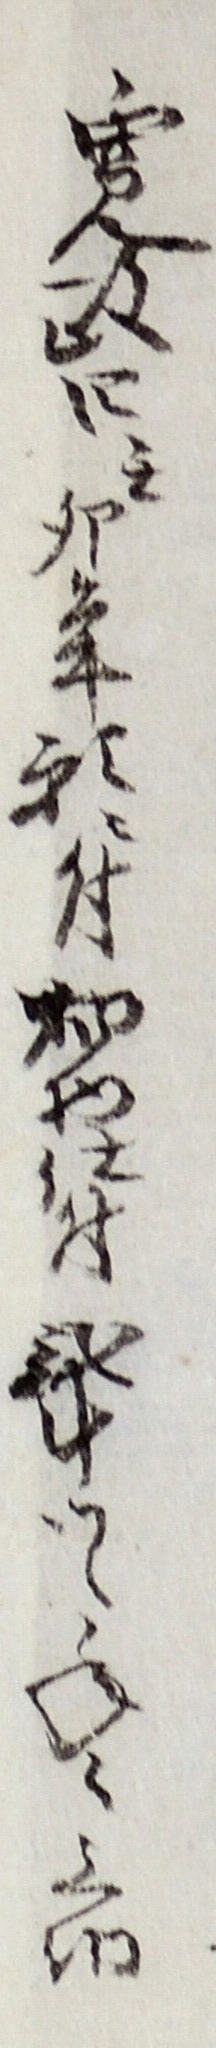寛政四壬子年願ニ付畑物仕付弐斗ツヽ年々上納
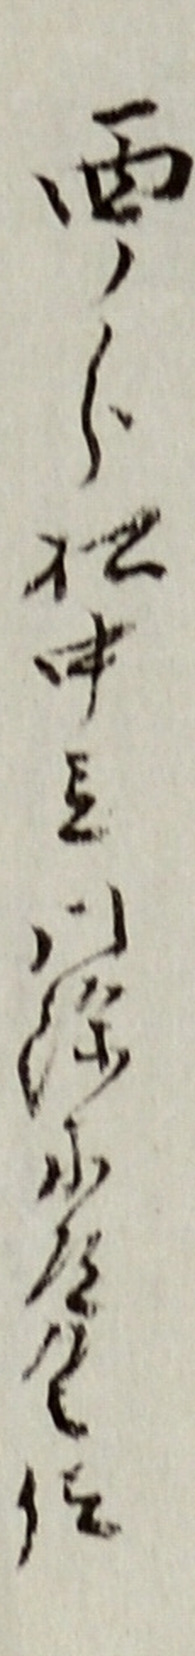西ノ分松中立川添小道具位
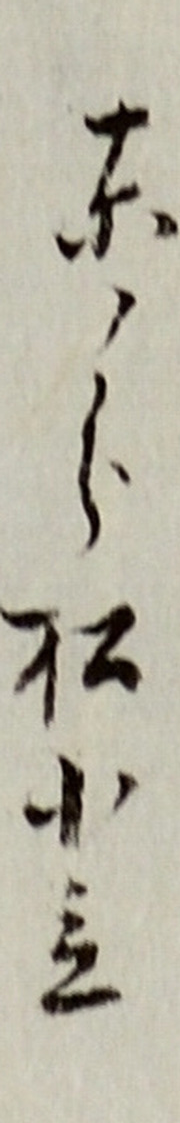東ノ分松小立

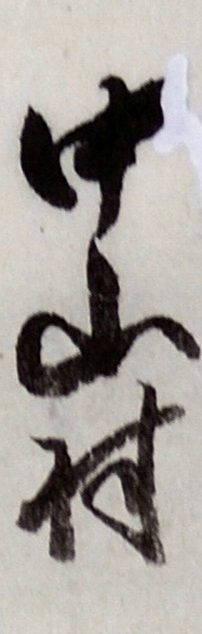中山村

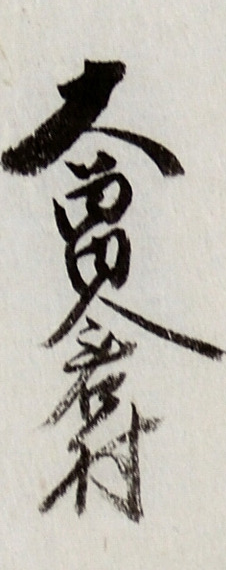大曾倉村
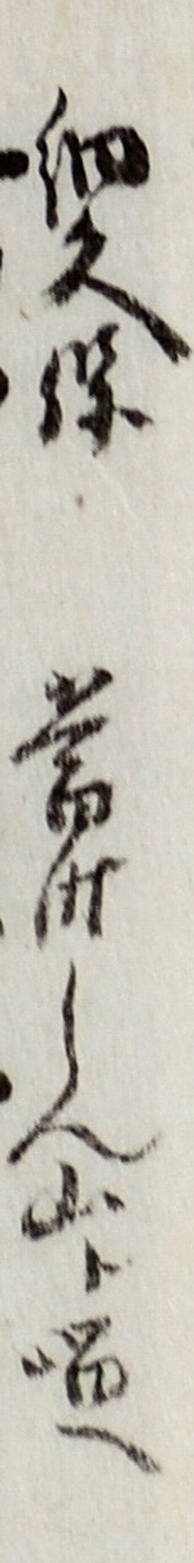細久保当時しん山ト唱へ
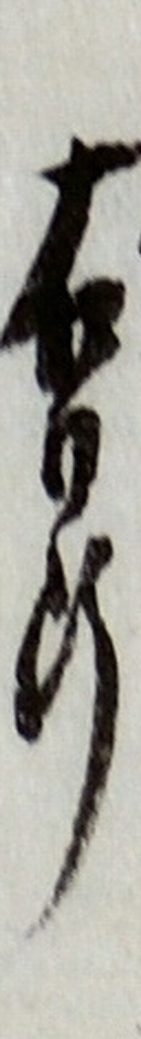右同断

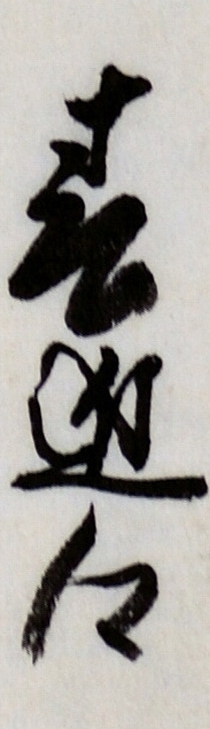春近郷
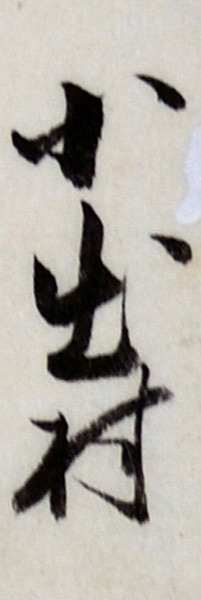小出村
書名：郷中御林御竹薮名所附守之名前帳
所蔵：伊那市立高遠町図書館・合同会社AMANE
